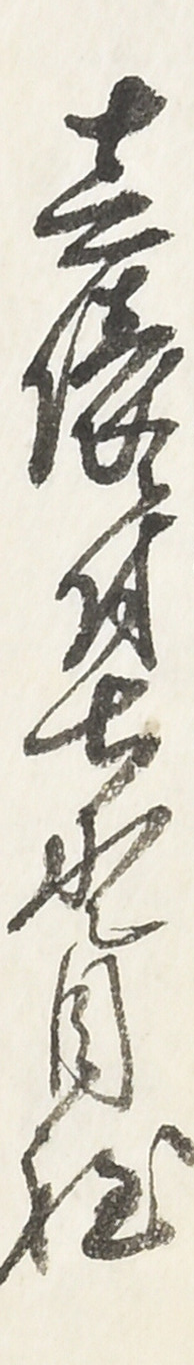壱俵ニ付七貫目程
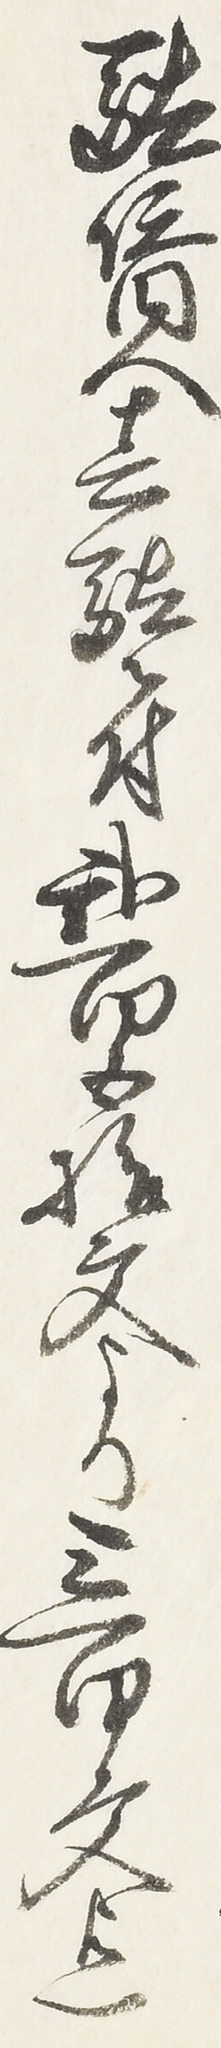駄賃壱駄ニ付弐百五拾文より三百文迄
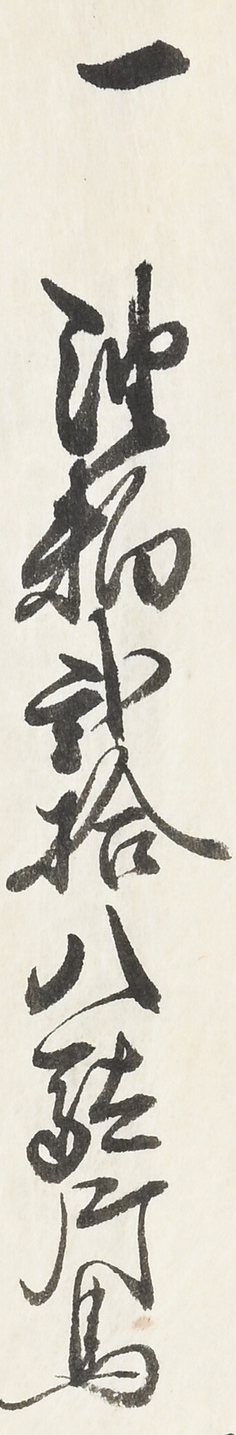一油粕弐拾八駄片馬但
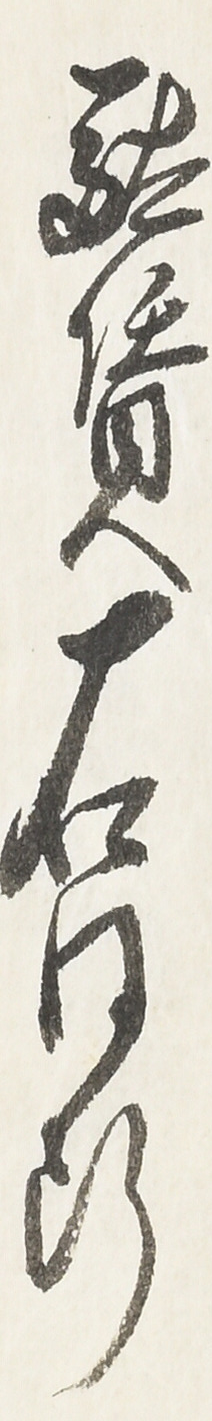駄賃右同断
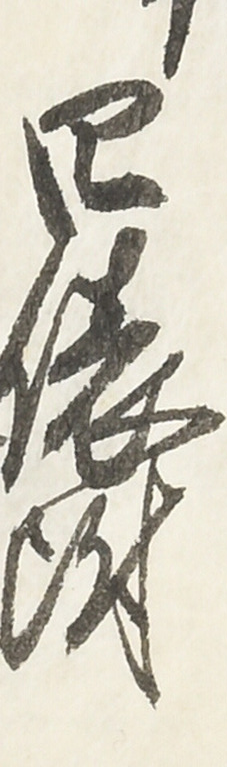四俵附
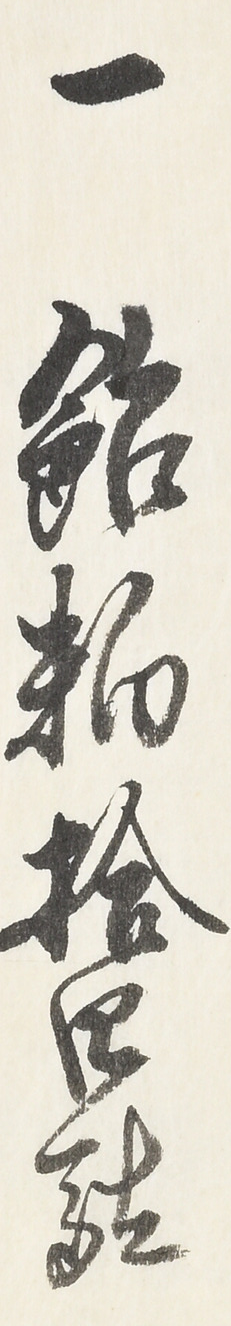一飴粕拾四駄但
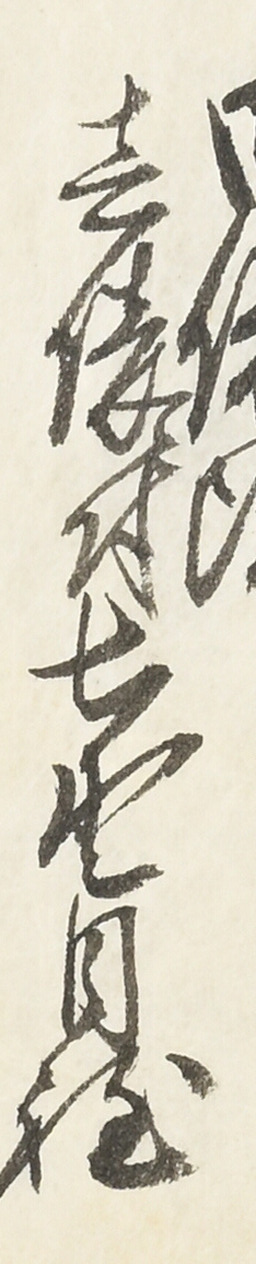壱俵ニ付七貫目程
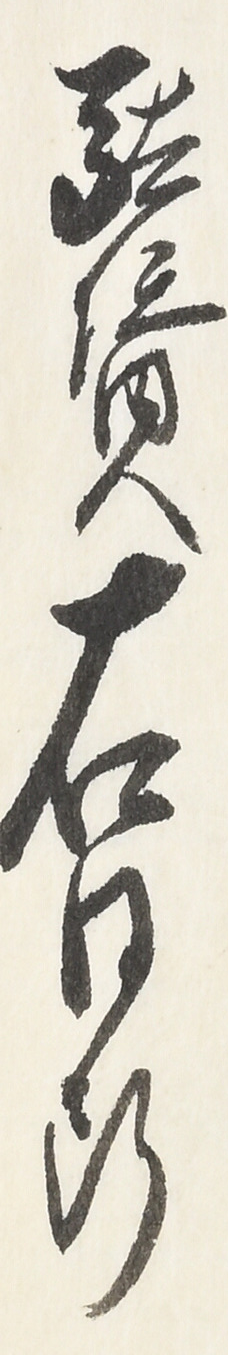駄賃右同断

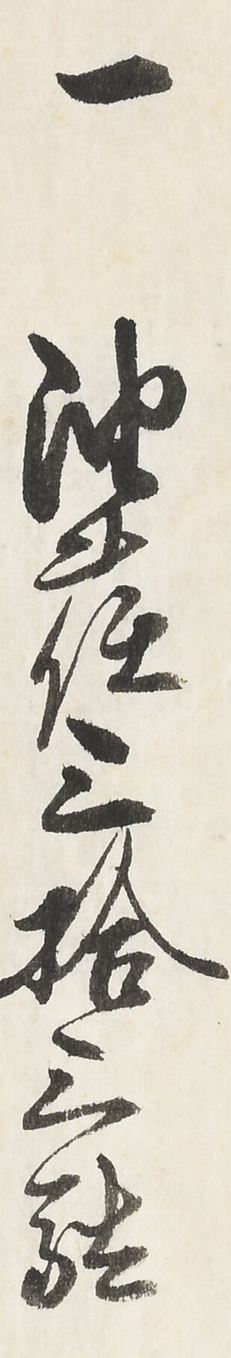一油荏三拾三駄但
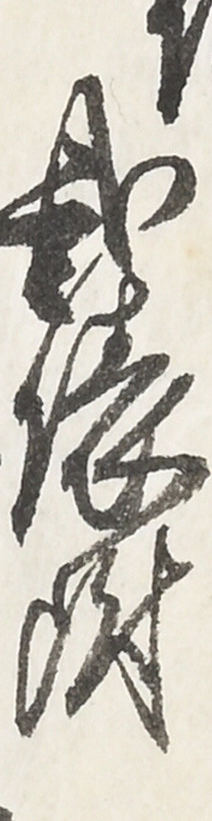弐俵附
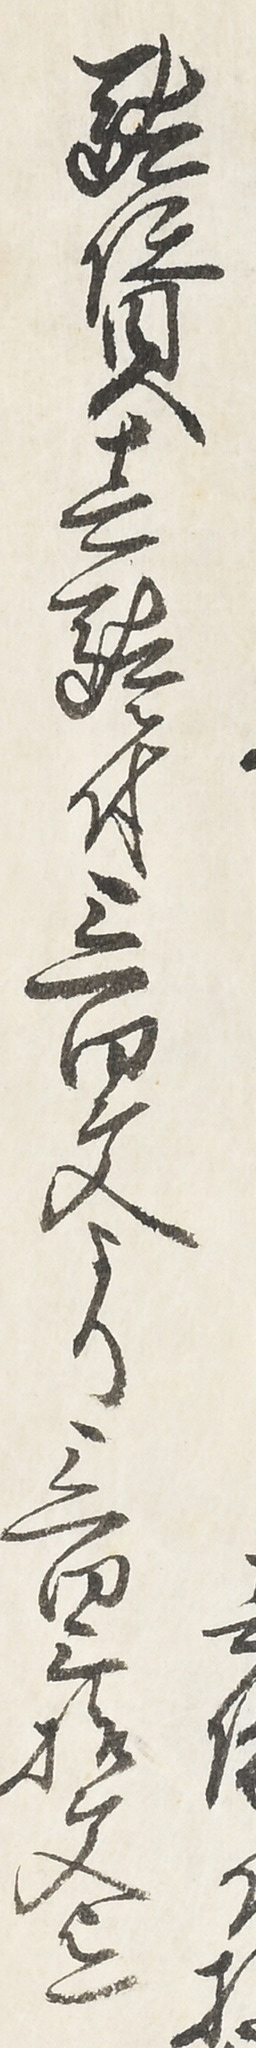駄賃壱駄ニ付三百文より三百三拾文迄
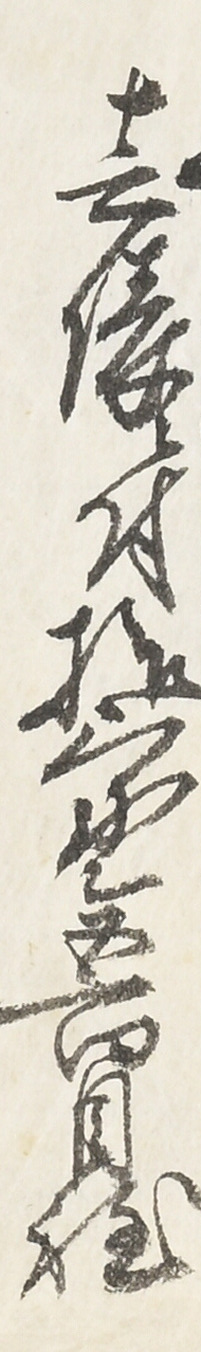壱俵ニ付拾三貫五百目程
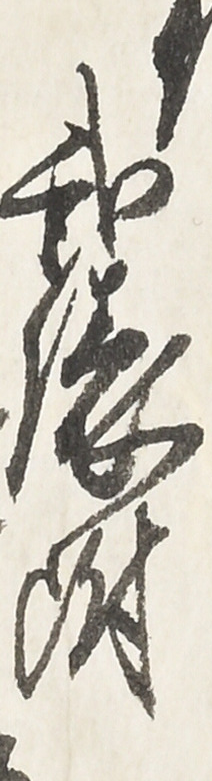弐俵附
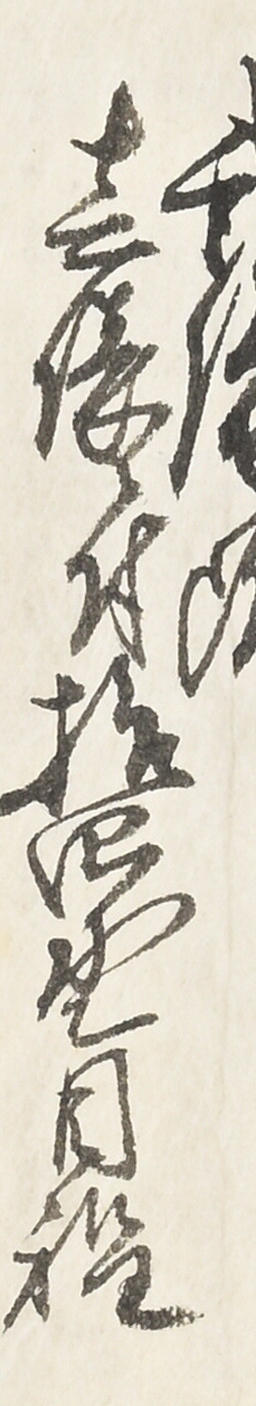壱俵ニ付拾四貫目程
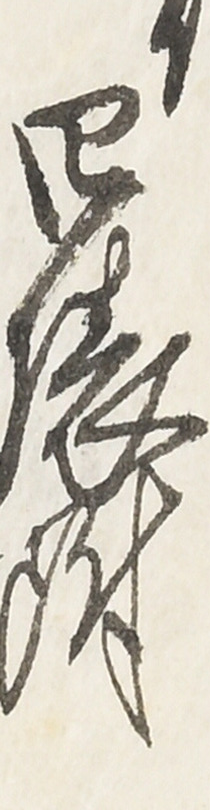四俵附
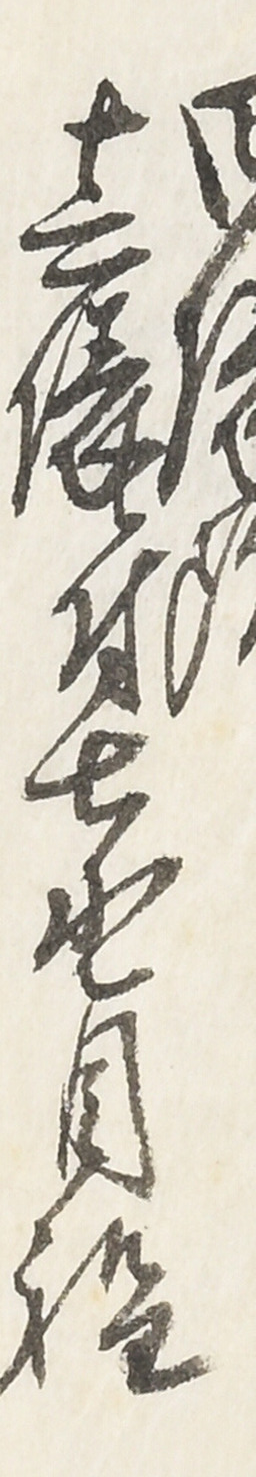壱俵ニ付七貫目程
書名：中馬ニテ附通候出入荷物目録帳
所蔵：伊那市立高遠町図書館・合同会社AMANE
